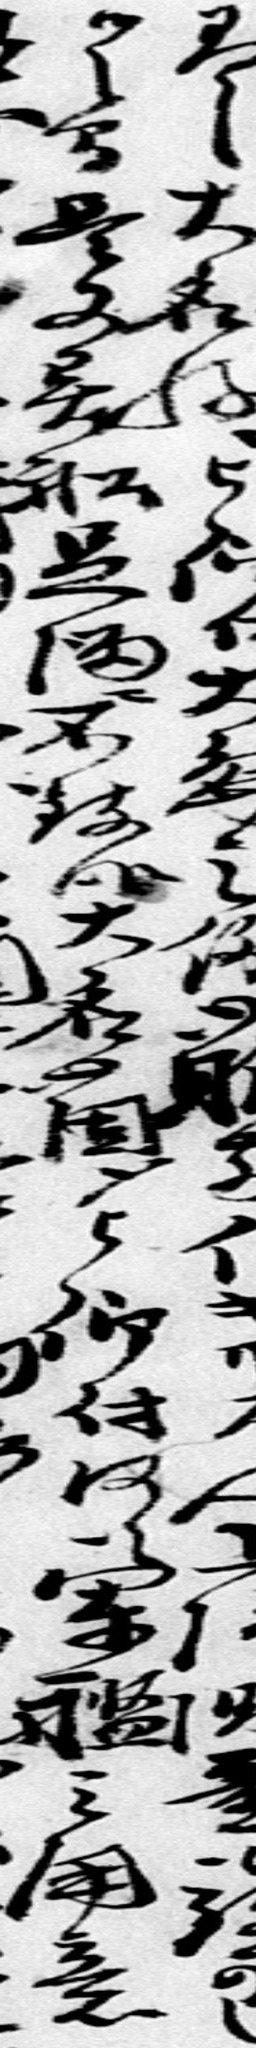候之間是又異船足溜に不致様大名御固め被仰付何も軍艦之用意
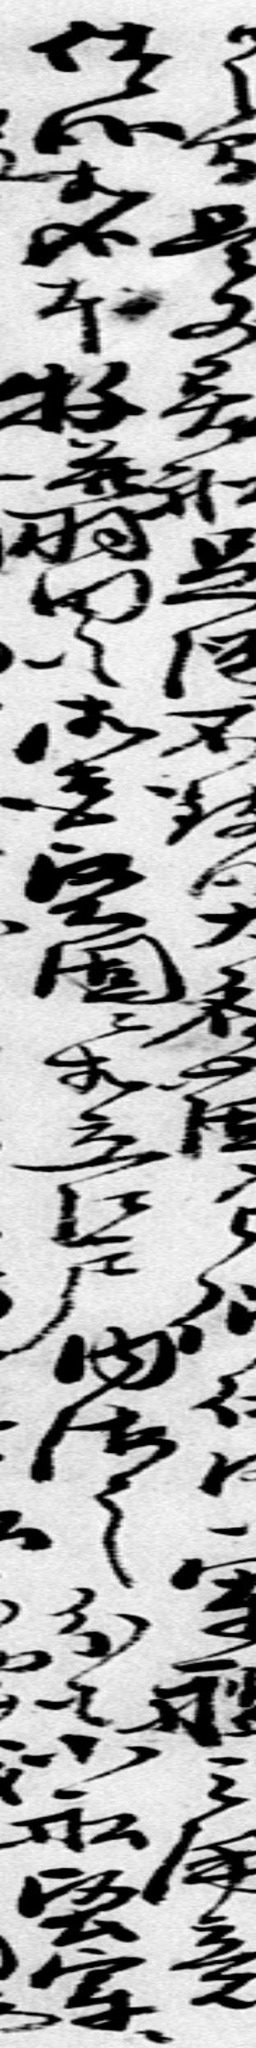仕候様相成本牧幷羽田も御固堅固に相立江戸内海之分も小船堅牢に
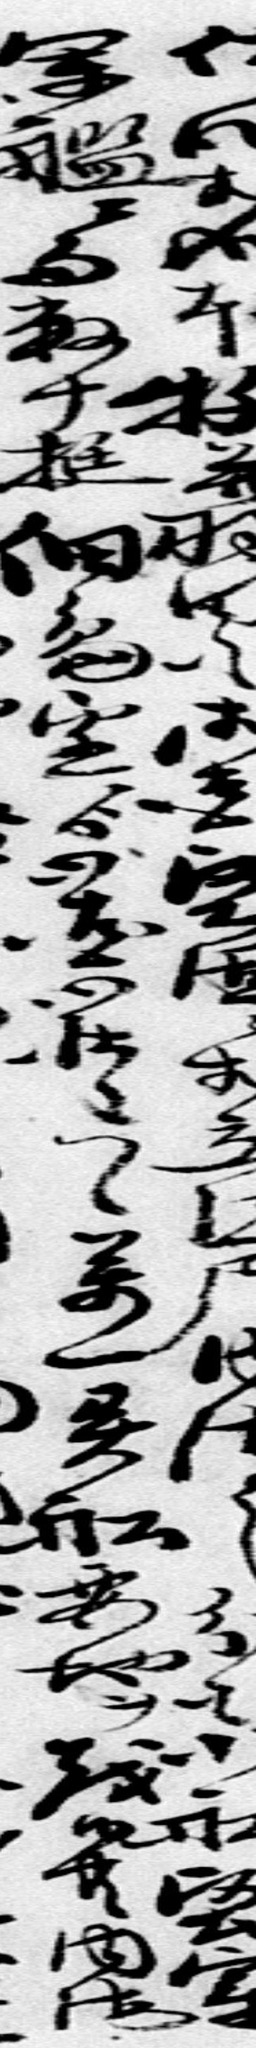軍艦に而数十挺佃島辺ゟ御固御座候はゝ万一異船要地を越候共内海
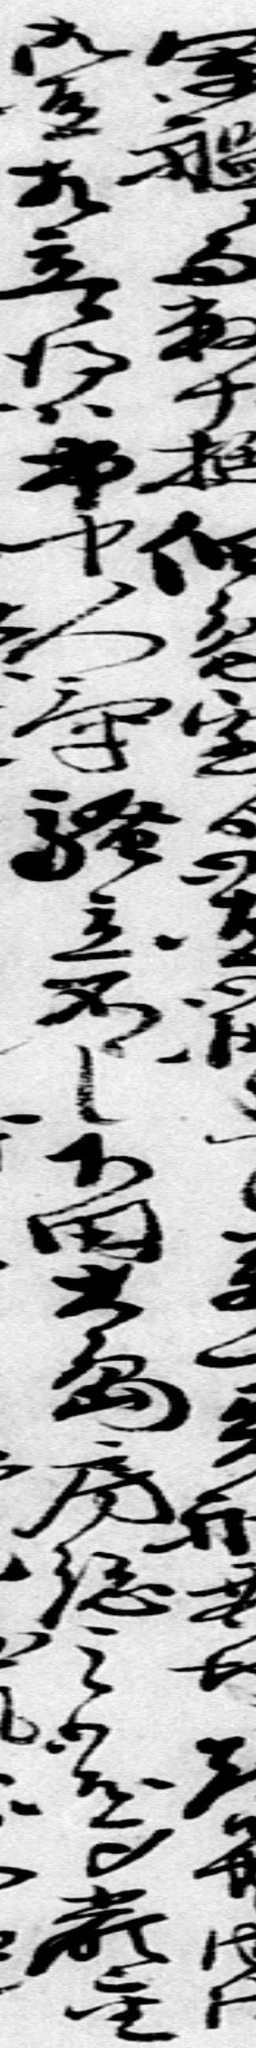御固相立候得は市中人気騒立不申下田大島房総之御固め厳重
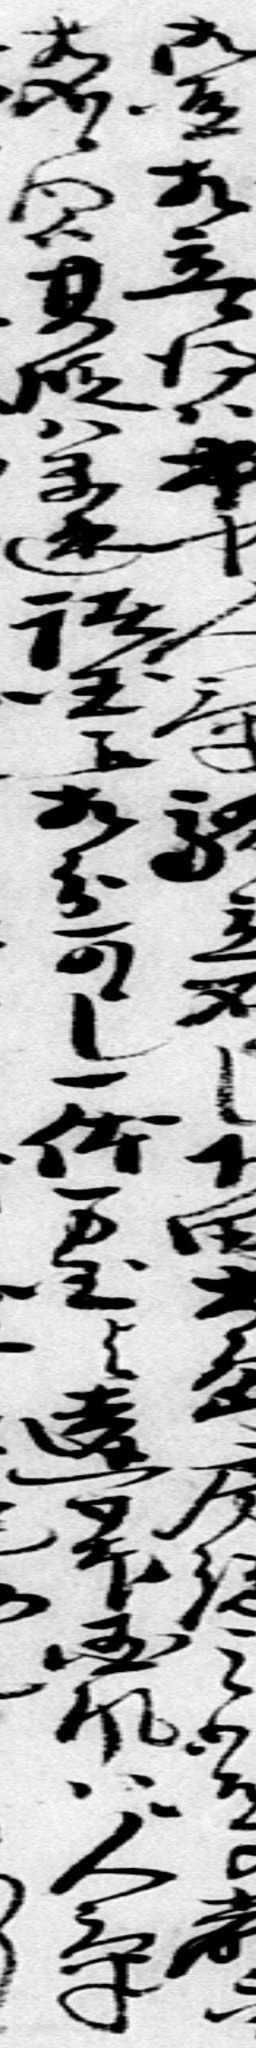相成候得は其段は早速諸国え相分可申候一体万国と違日本国風は人気
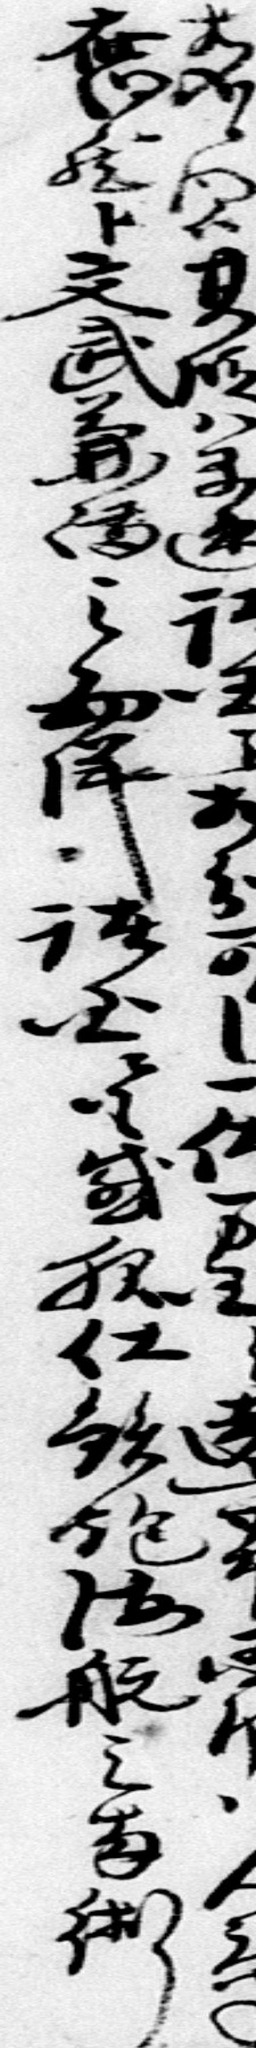旧然と文武兼備之西洋諸国にも感服仕鉄砲海航之両術

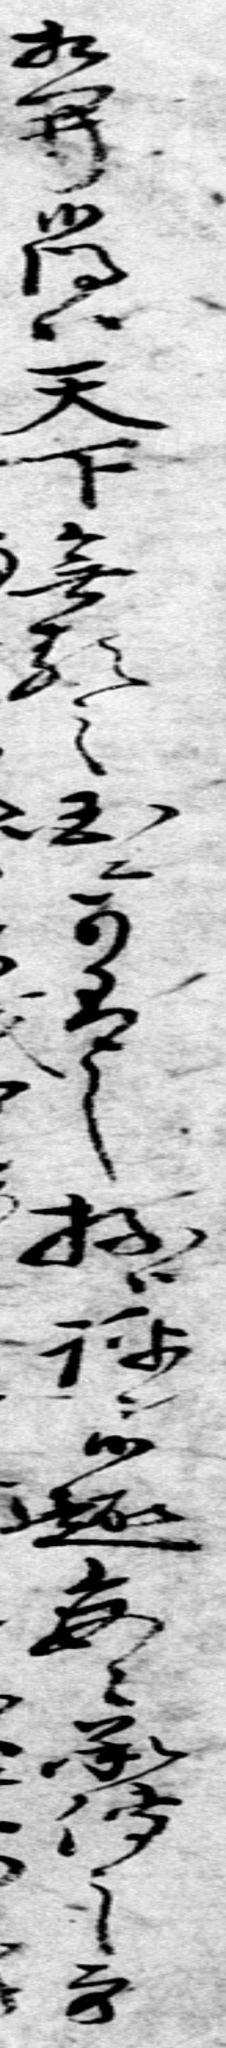相開候得は天下無類之国に可有之抔と評し候趣段々承伝にも候事
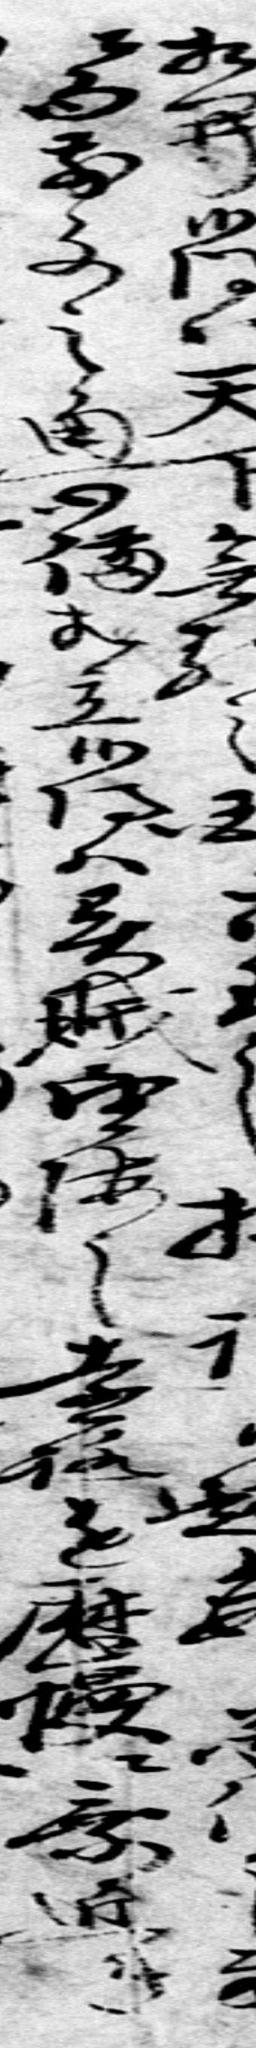に而前文之通御備相立候得は異賊望海之遠路を歴慢に乗近き
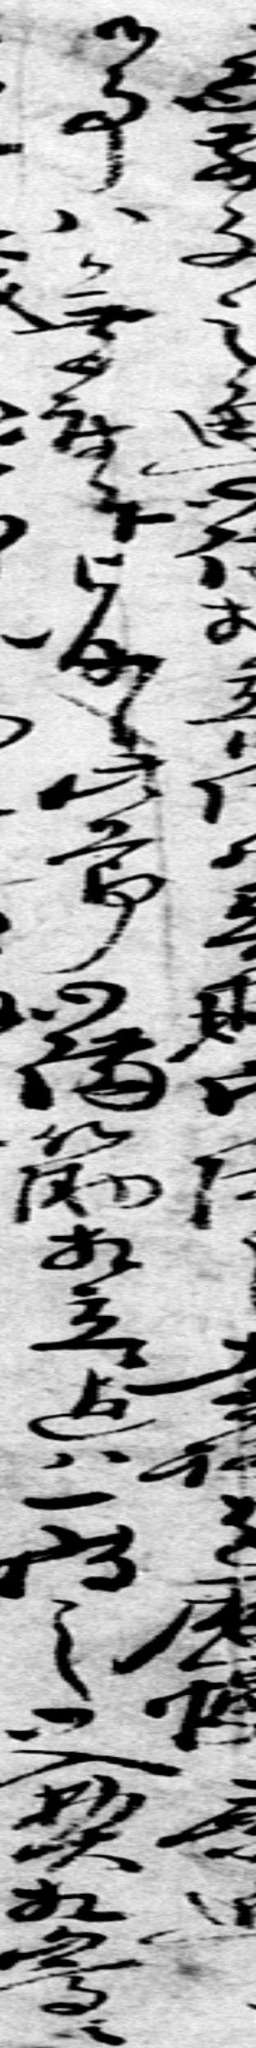候事は無御座候と被存候此節御備筋相立候迄は一時之御入費相嵩候
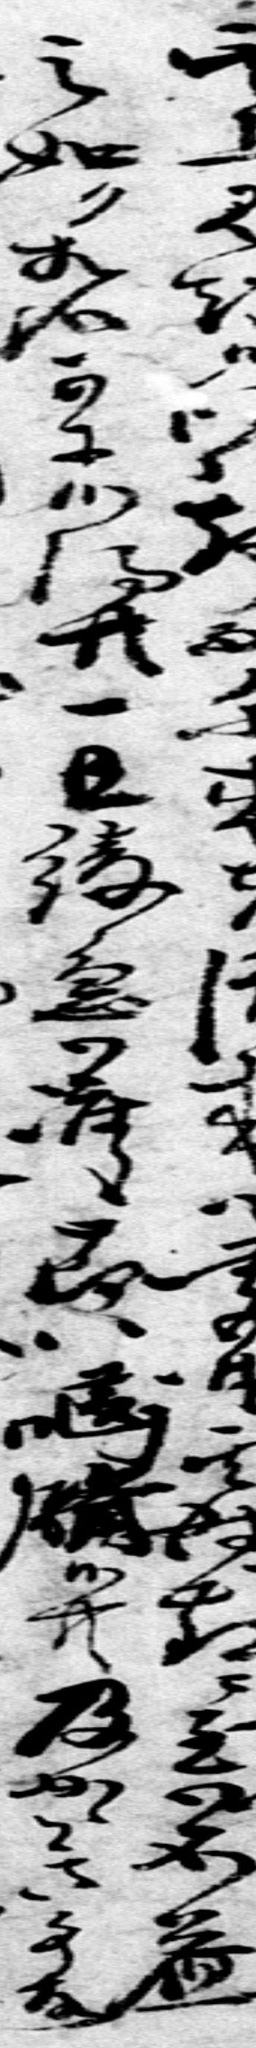之如く相成かに候得共一旦緩急御座候節は噛臍候共及かたき事故
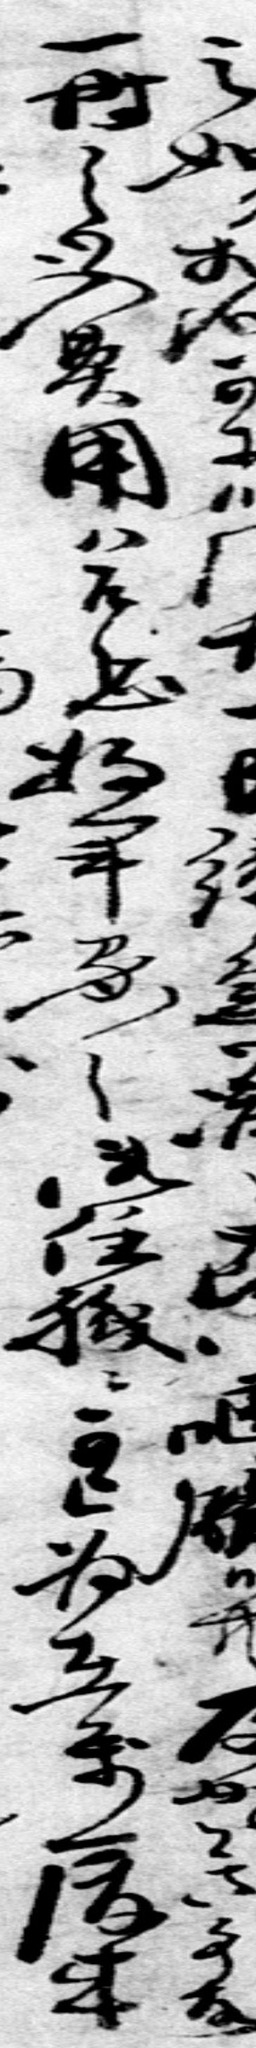一時之御入費用は乍恐将軍家之御任職に可被為在万一渡来
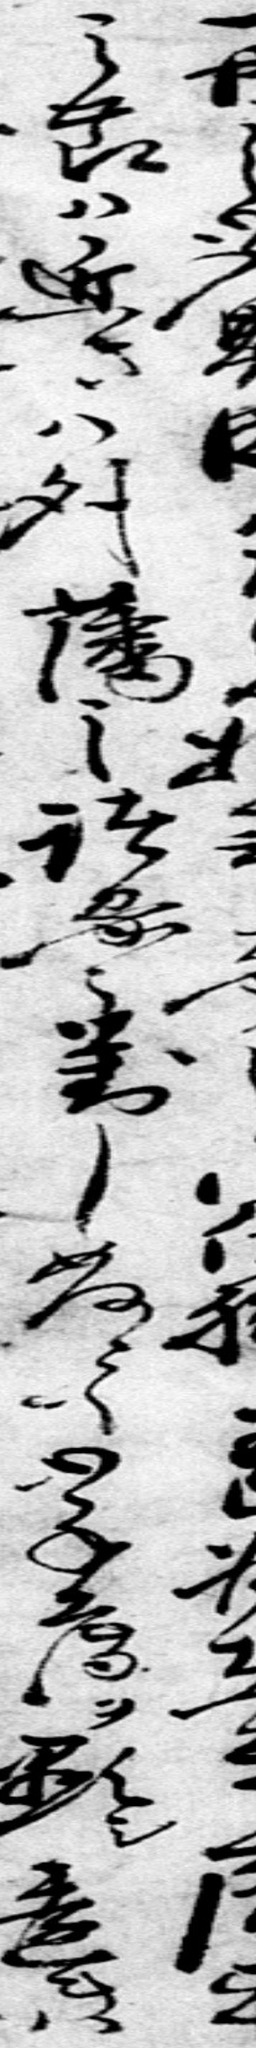之節は近きは外藩之諸家に対し如何にも御手薄を顕し遠きは
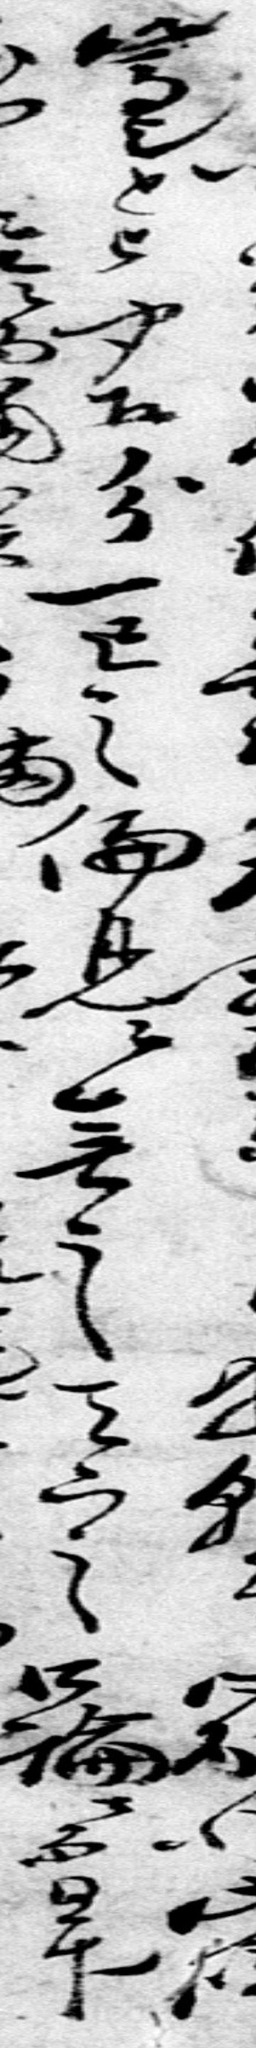篤と被聞召分一己之偏見に無之天下之口論に而日本
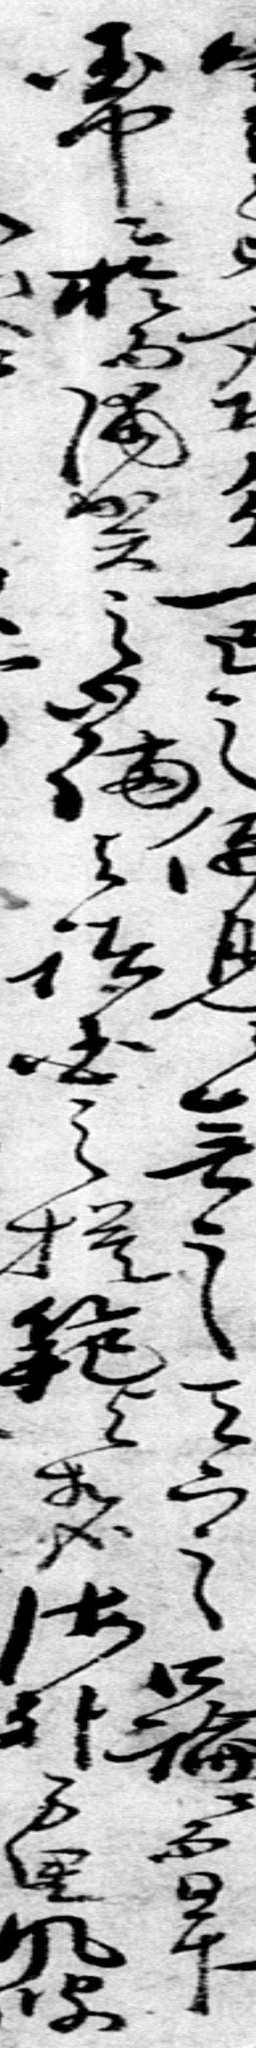国中に於而浦賀之御備は諸国之模範と相成海外万里風波
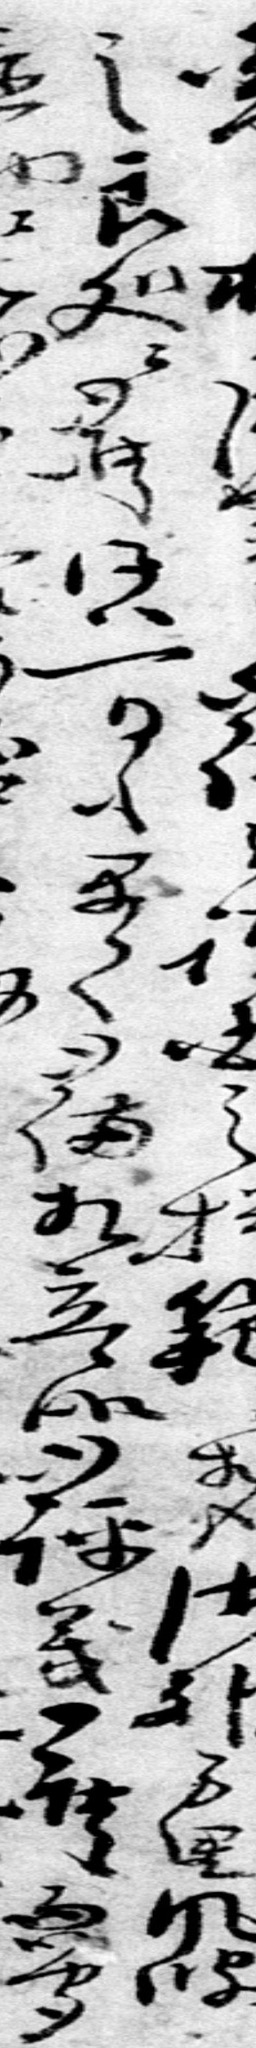之良処に御座候得は一日も早く御備相立候様御評義御座候而御聞
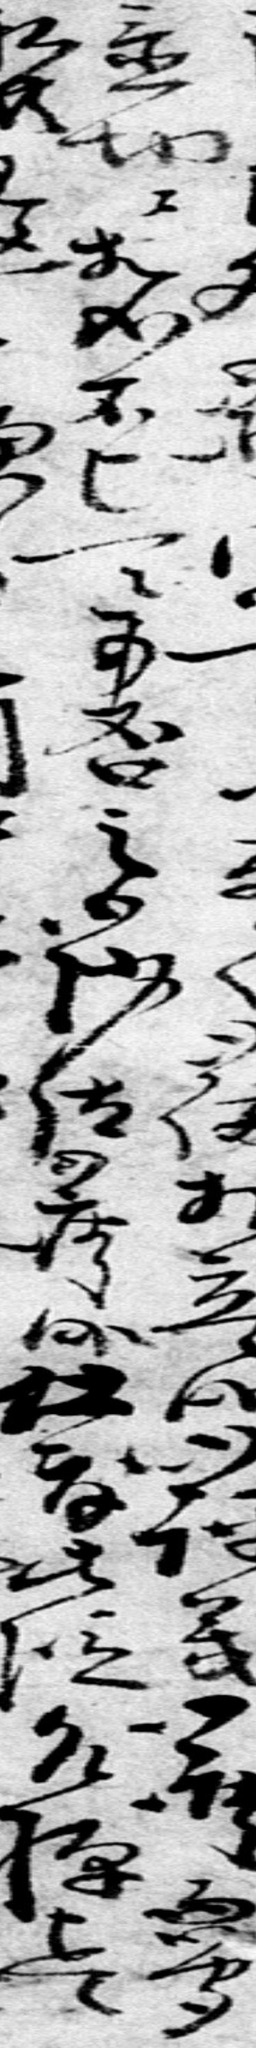置切に相成不申一々可否之御沙汰御座候様仕度此段乍憚申上候
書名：浦賀御奉行見込秘書写
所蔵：徳島県立図書館
